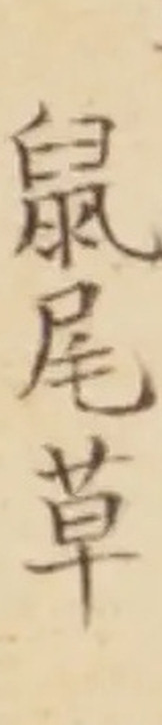鼠尾草
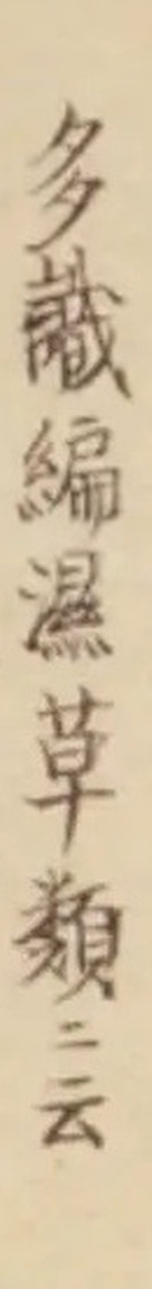多識編湿草類云
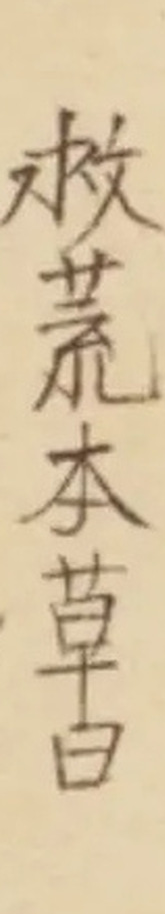救荒本草曰
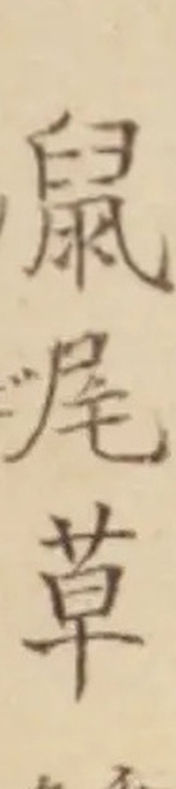鼠尾草
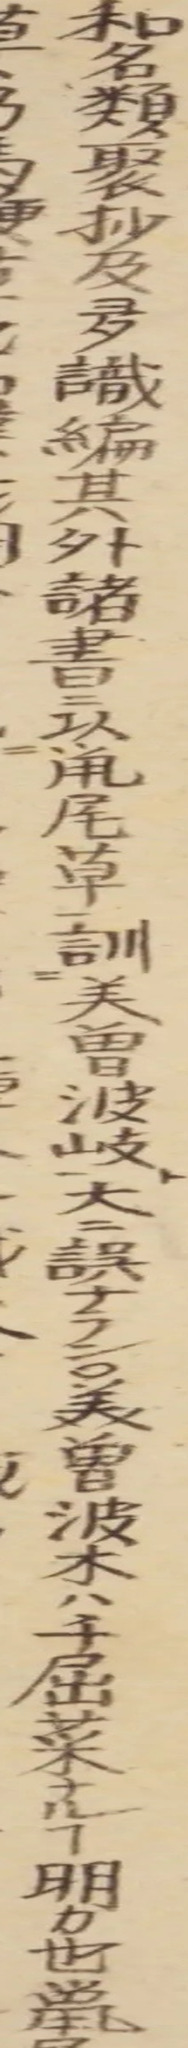和名類聚抄及多識編其外諸書ニ以鼠尾草訓美曽波岐大ニ誤ナラン○美曽波木ハ千屈菜ナルヿ明カ也鼠尾
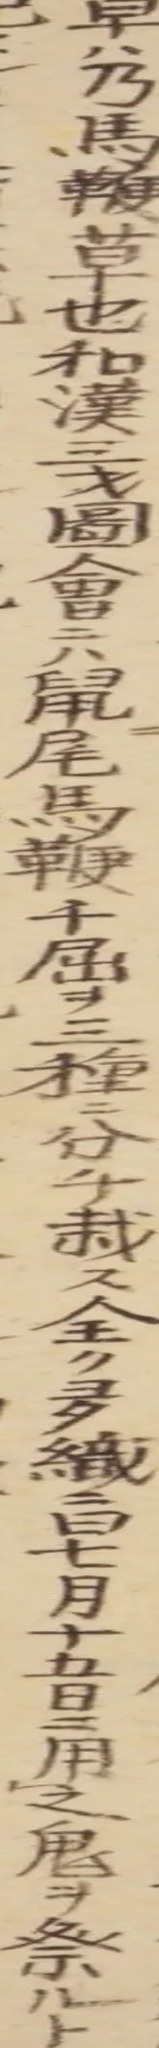草ハ乃馬鞭草也和漢三才図会ニハ鼠尾馬鞭千屈ヲ三種ニ分チ栽ス全ク多識ニ曰七月十五日ニ用之鬼ヲ祭ルト
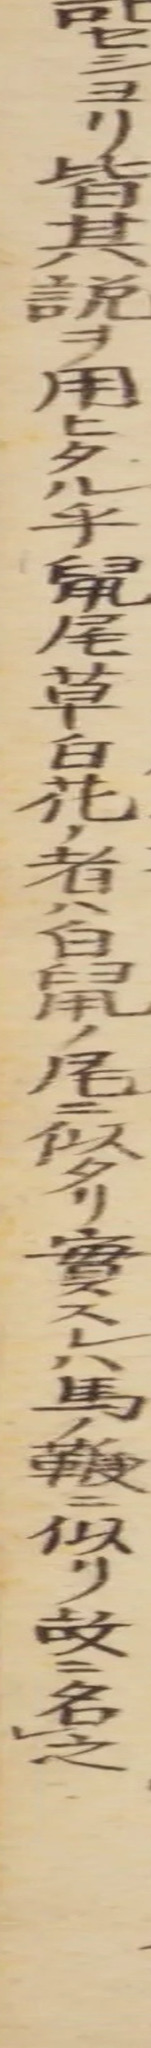記セシヨリ皆其説ヲ用ヒタル乎鼠尾草白花ノ者ハ白鼠ノ尾ニ似タリ実スレハ馬ノ鞭ニ似リ故ニ名之

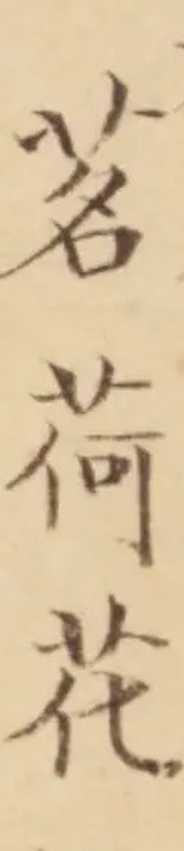茗荷花
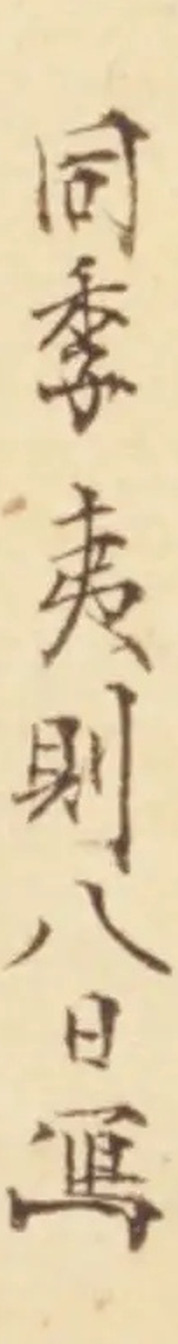同季夷則八日写
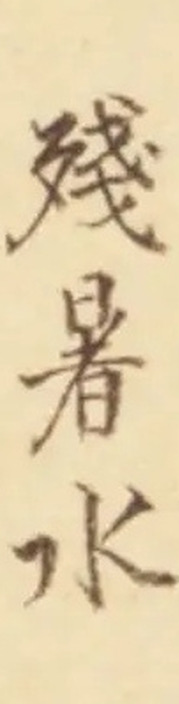残暑水
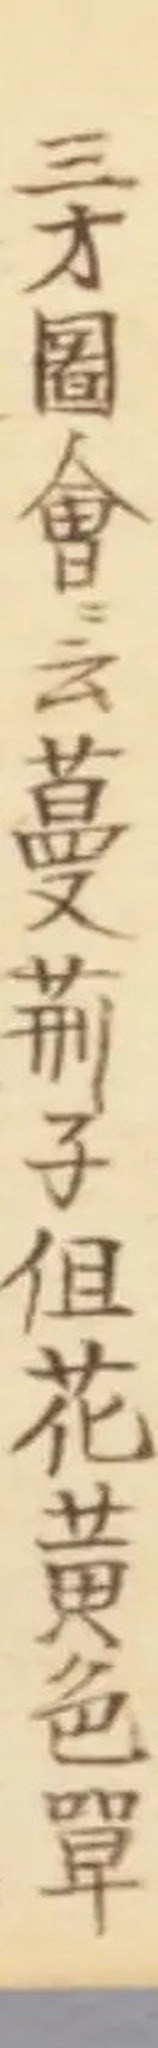三才図会云蔓荊子但花黄色単
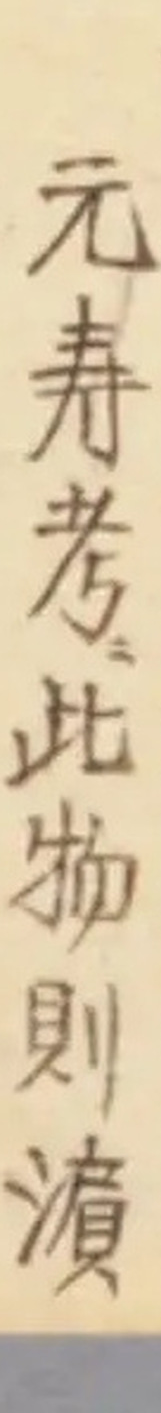元寿考此物則
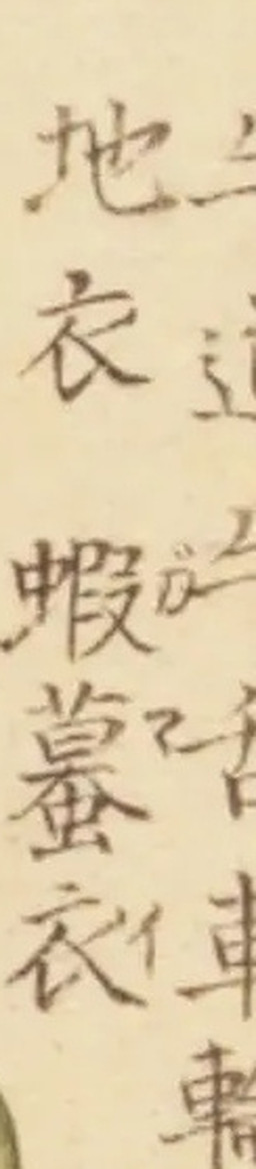地衣蝦蟇衣
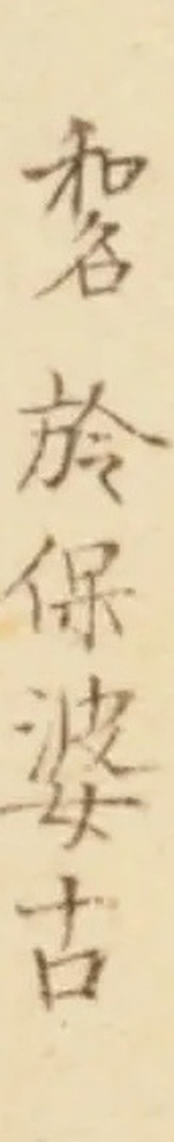和名𣃠保婆古
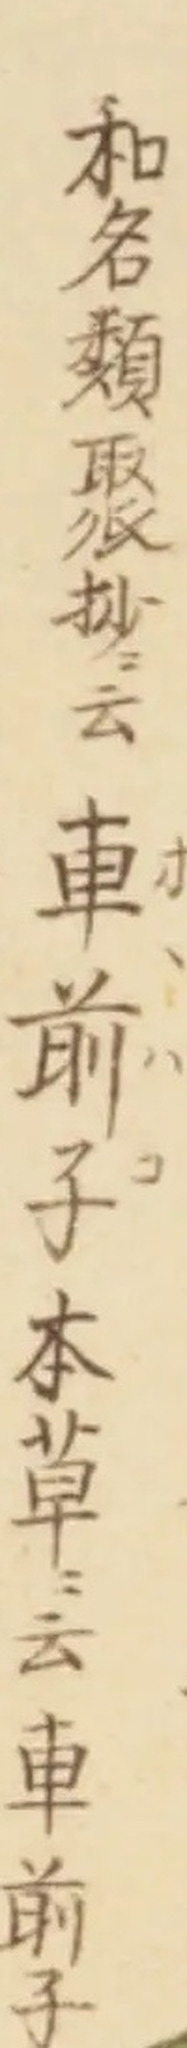和名類聚抄云車前子本草云車前子
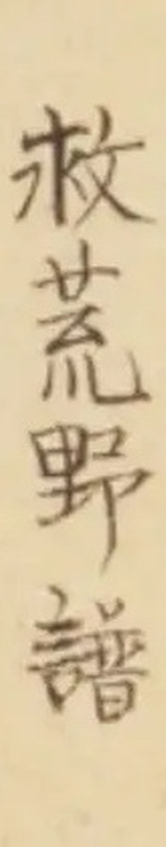救荒野譜
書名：梅園草木花譜秋之部. 1
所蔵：国立国会図書館 National Diet Library, JAPAN
